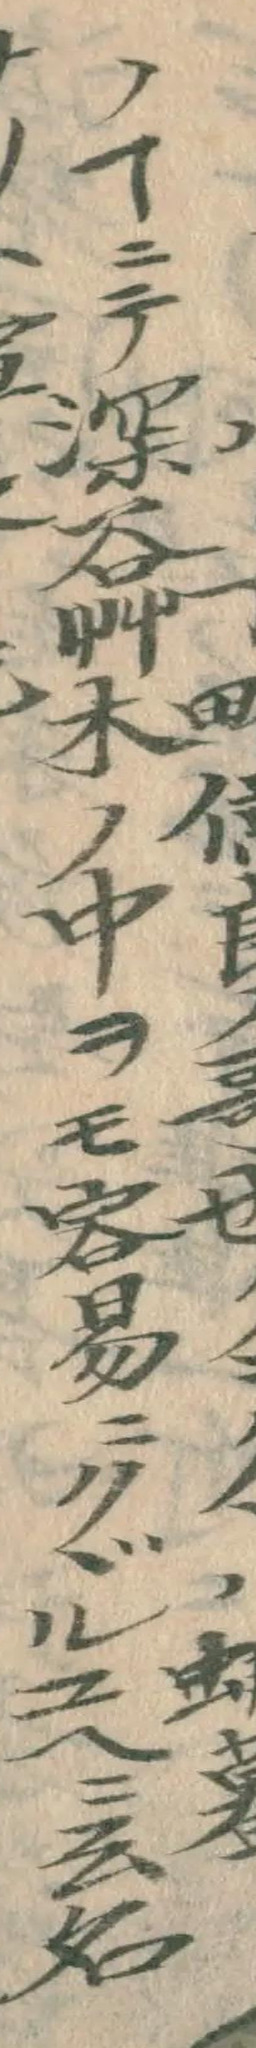ノコトニテ深谷艸木ノ中ヲモ容易ニクヾルユヘニ云名
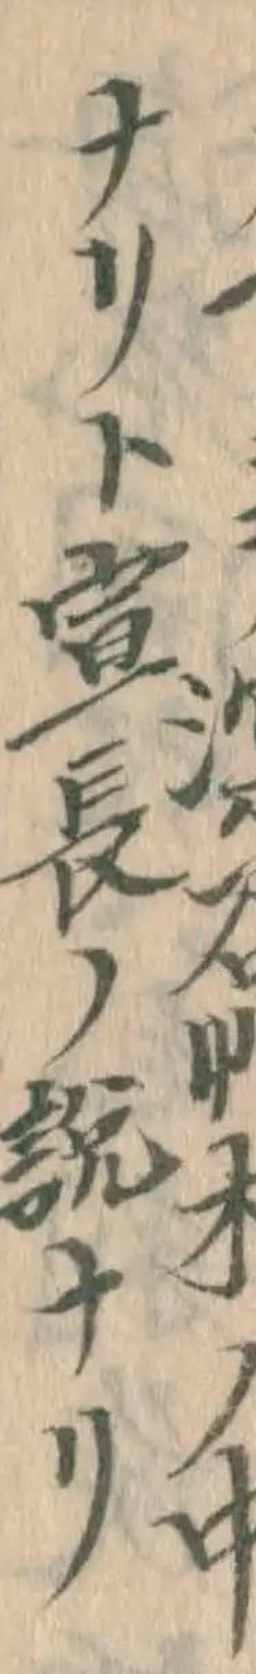ナリト宣長ノ説ナリ

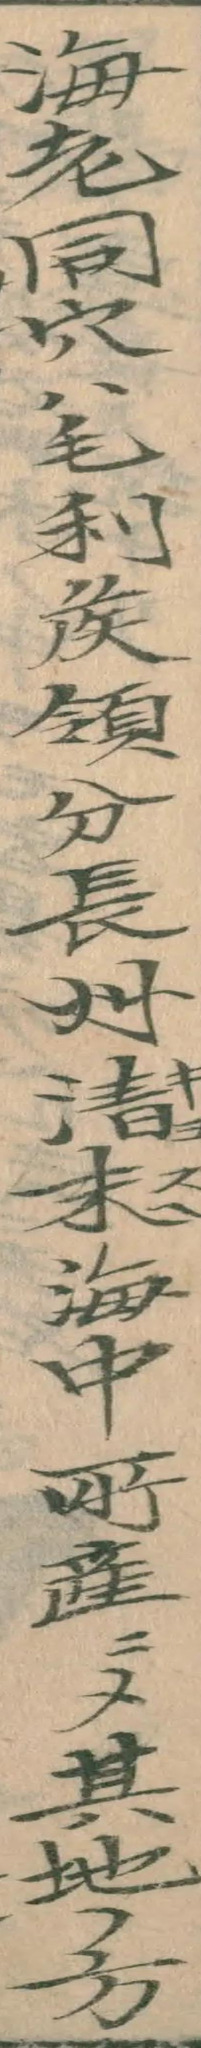海老同穴ハ毛利矦領分長州清末海中所産ニシテ其地ノ方
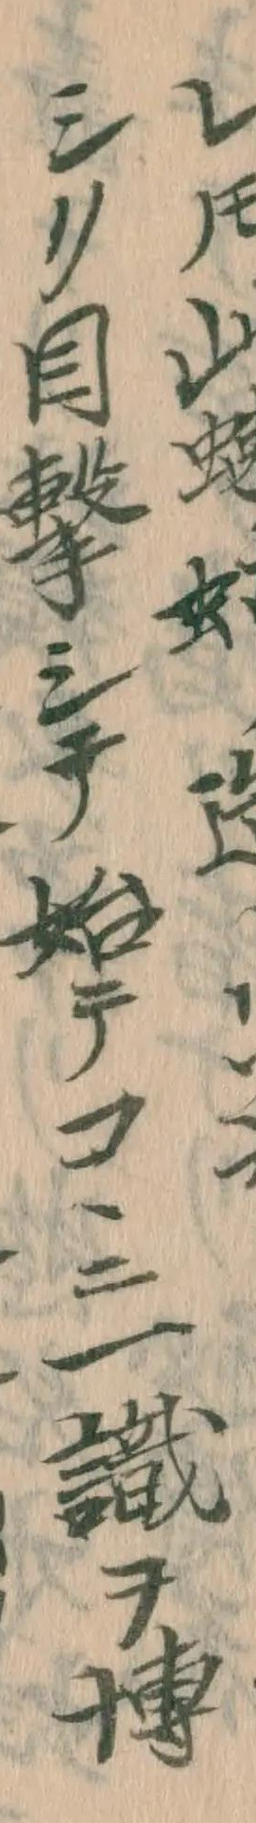シク目撃シテ始テコヽニ一識ヲ博
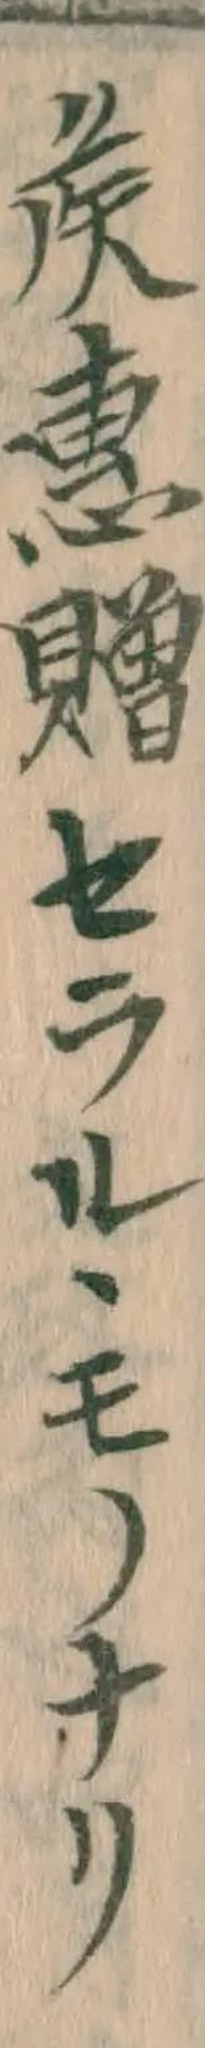矦惠贈セラルヽモノナリ
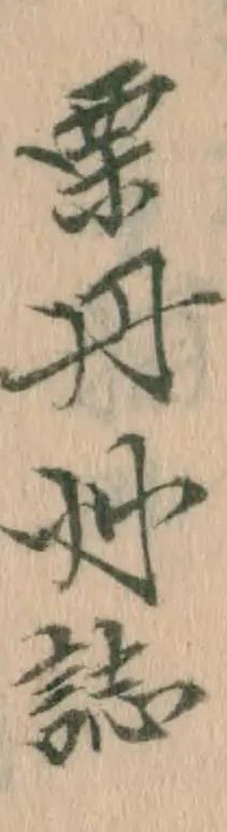栗丹州誌
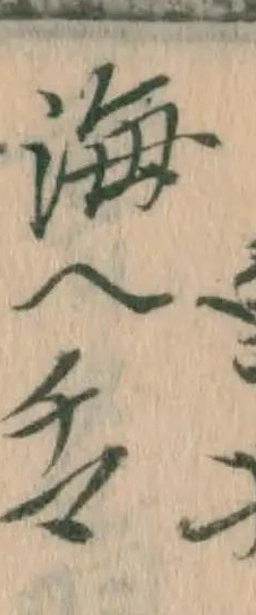海ヘチマ
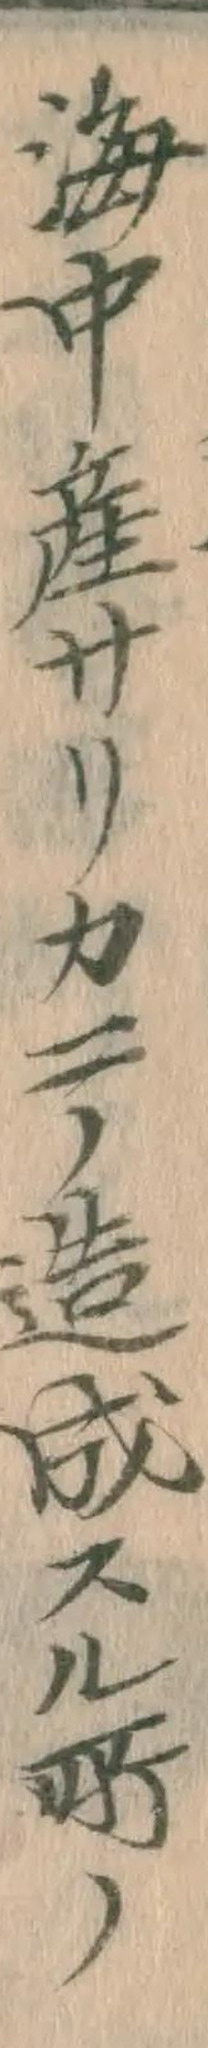海中産サリカニノ造成スル所ノ
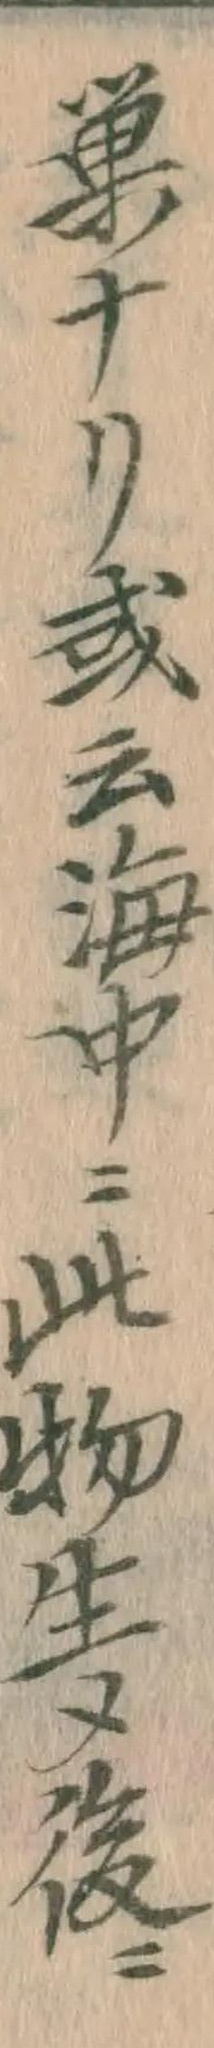巣ナリ或云海中ニ此物生シテ後ニ
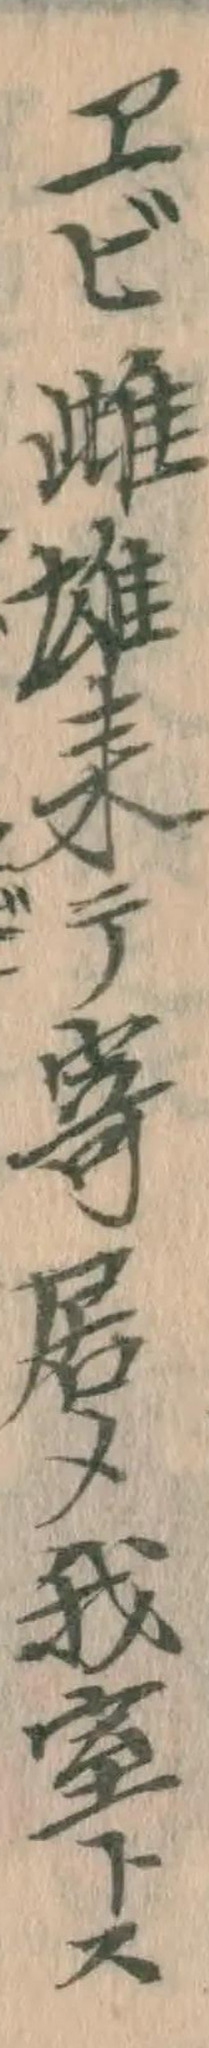ヱビ雌雄来テ寄居シテ我室トス
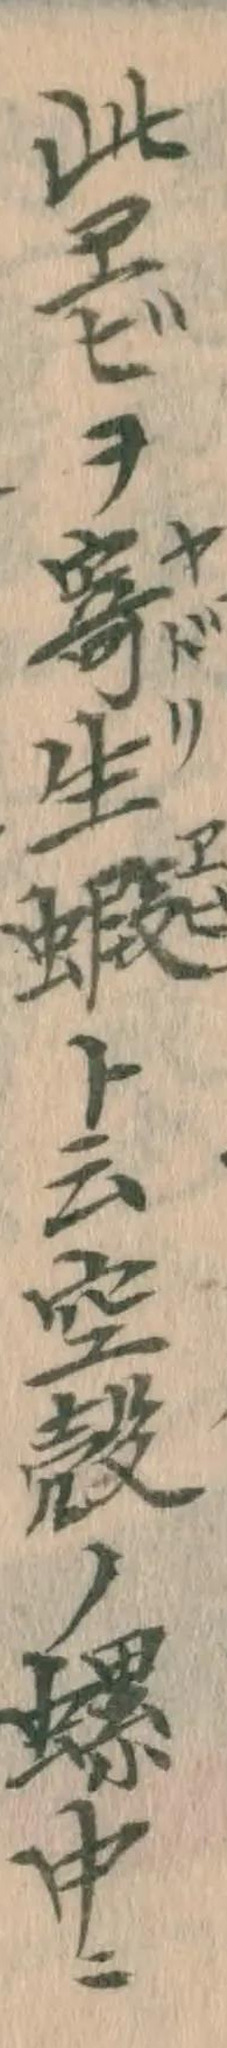此ヱビヲ寄生蝦ト云空殻ノ螺中ニ
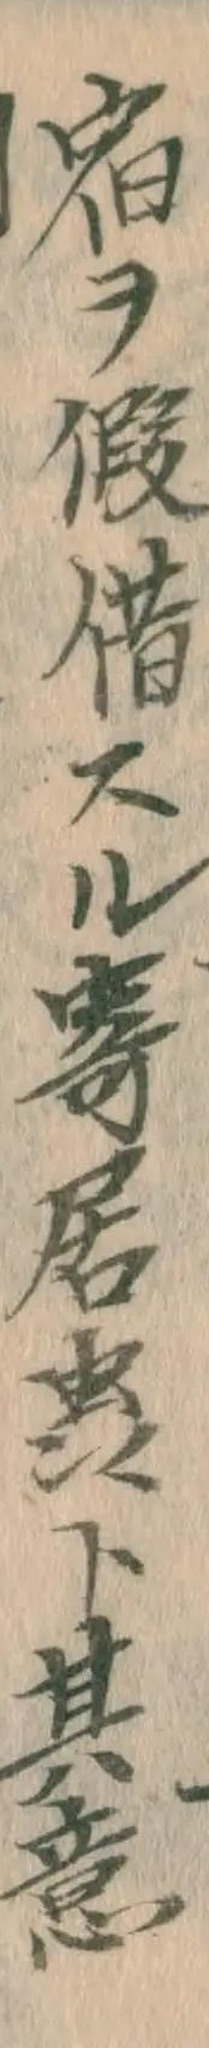宿ヲ假借スル寄居蟲ト其意
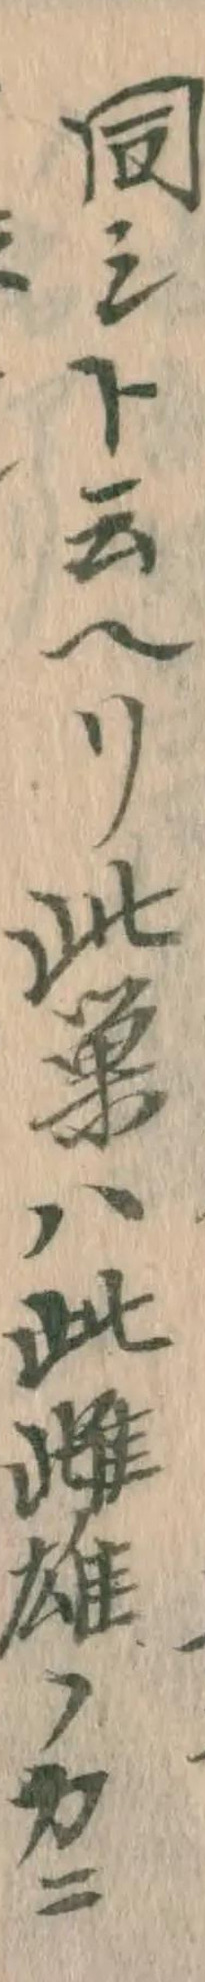同シト云ヘリ此巣ハ此雌雄ノカニ
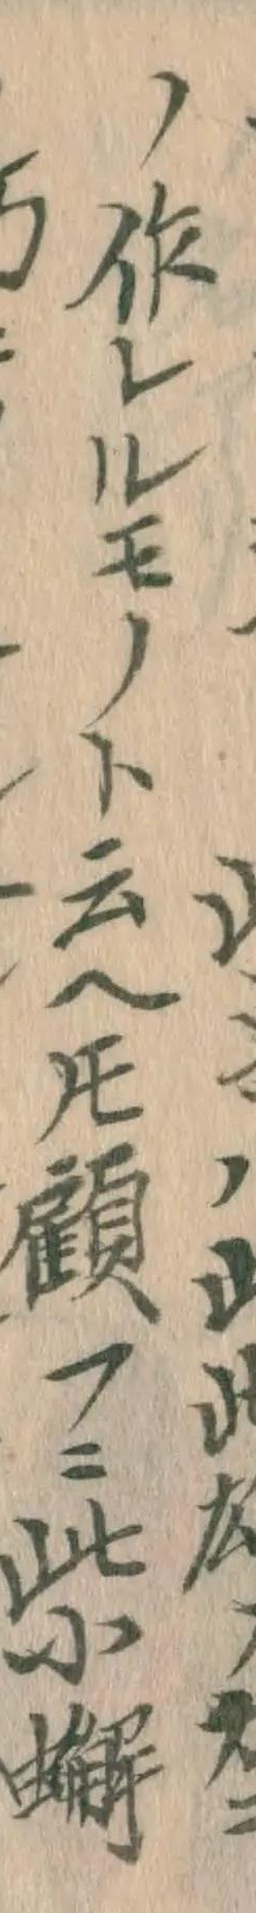ノ作レルモノト云ヘトモ顧フニ此小蠏
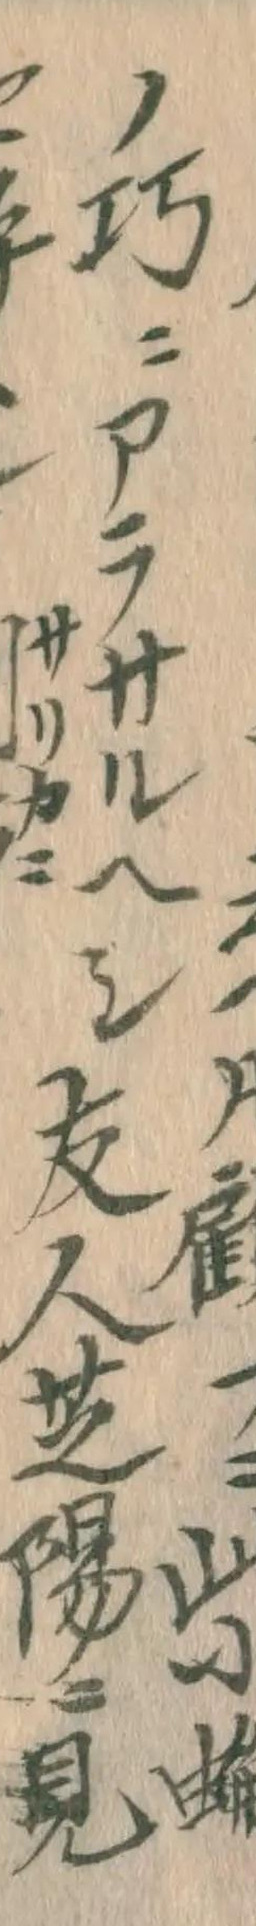ノ巧ニアラサルヘシ友人芝陽ニ見
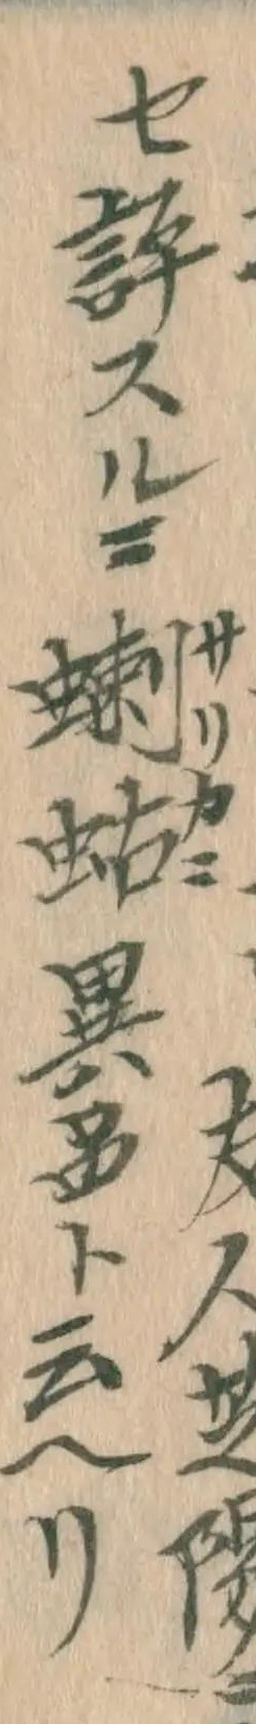セ評スルニ蝲蛄異品ト云ヘリ
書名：千蟲譜 3巻. [2]
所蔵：国立国会図書館 National Diet Library, JAPAN
